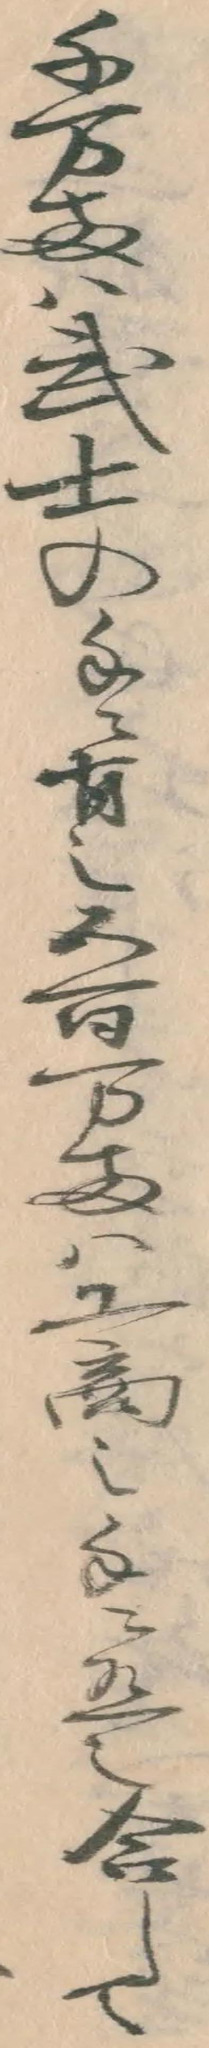千万両は武士の手に有之五百万両は工商之手に有之合して
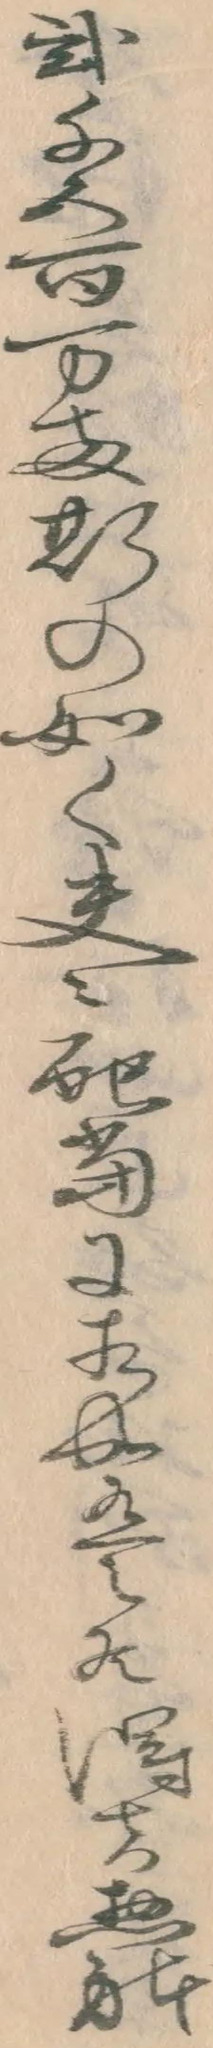弐千五百万両斯の如く夫々配当に相成有之候得は惣体
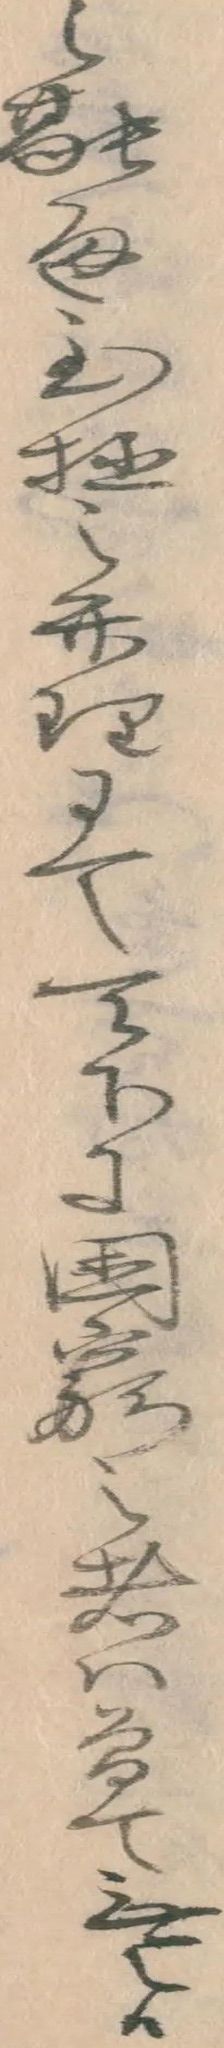之融通至極之弁理にて天下に困窮之者は曽て無之候
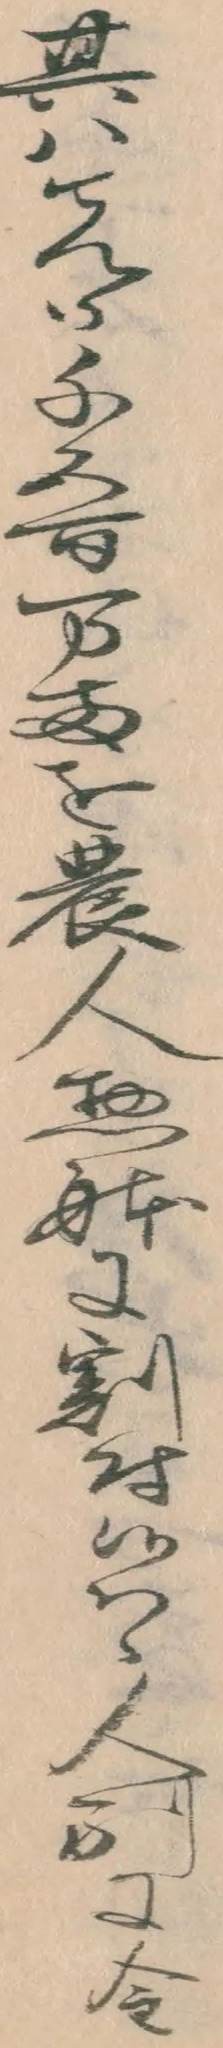其は先つ千五百万両を農人惣体に割付候はゝ人別に金
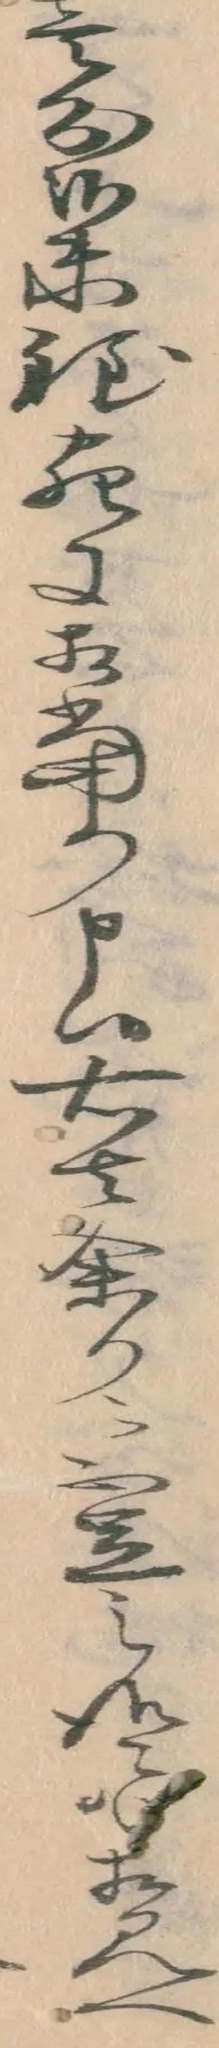壱分弐朱程宛に相当り申候右は余りに不足之様にも相見へ
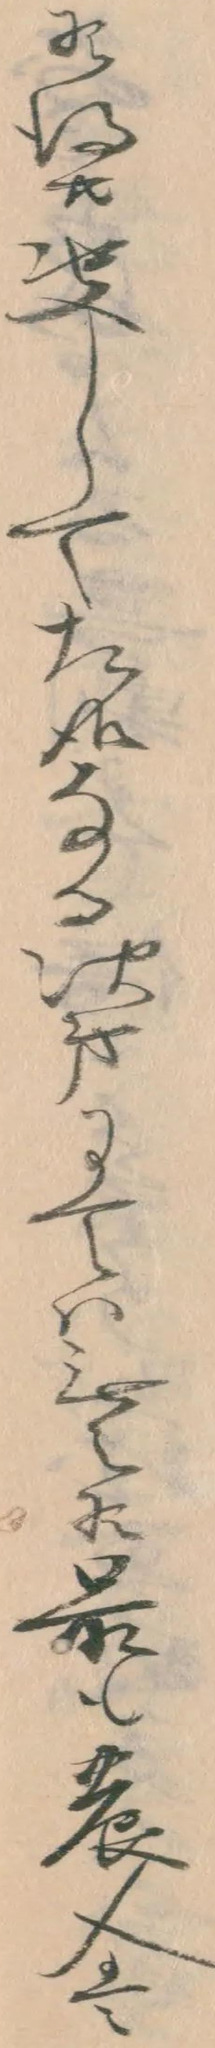候得共決して左様なる次第にては無之候最も農人は
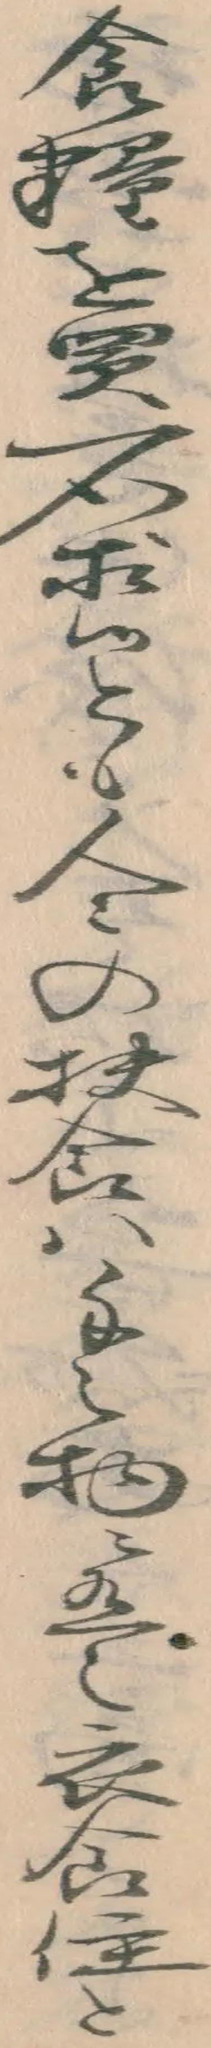食糧を買不求候とも人々の扶食は手之物に有之衣食住と
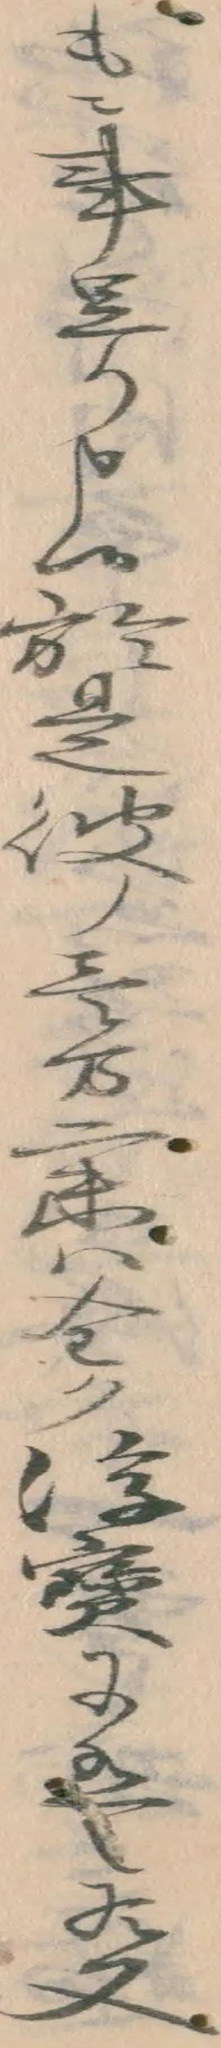もに事足り申候於是彼の壱分二朱は全く浮宝に有之候又
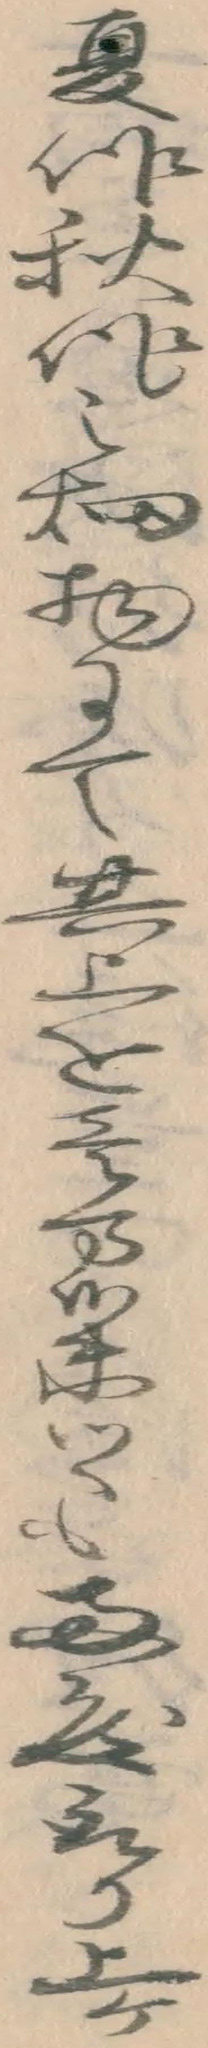夏作秋作之畑物にて其上を壱分弐朱つゝも両度取り上け
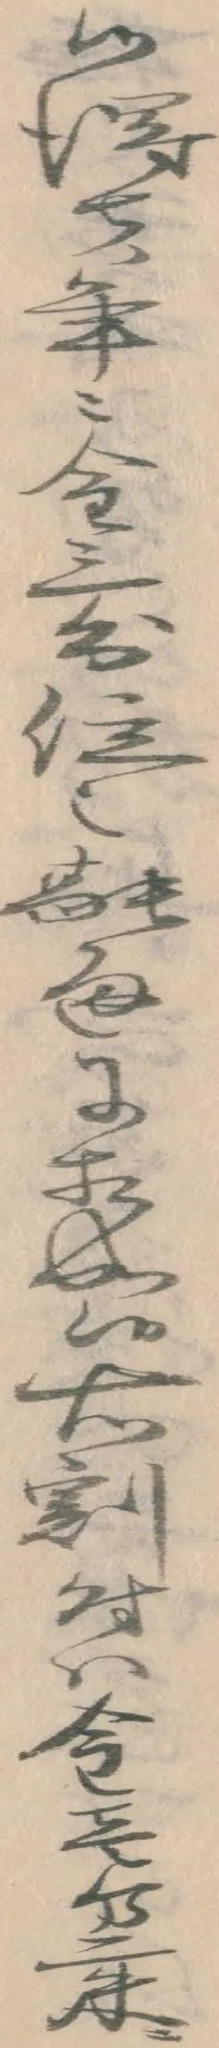候得は年々金三分位之融通に相成候右割付は金壱分二朱に
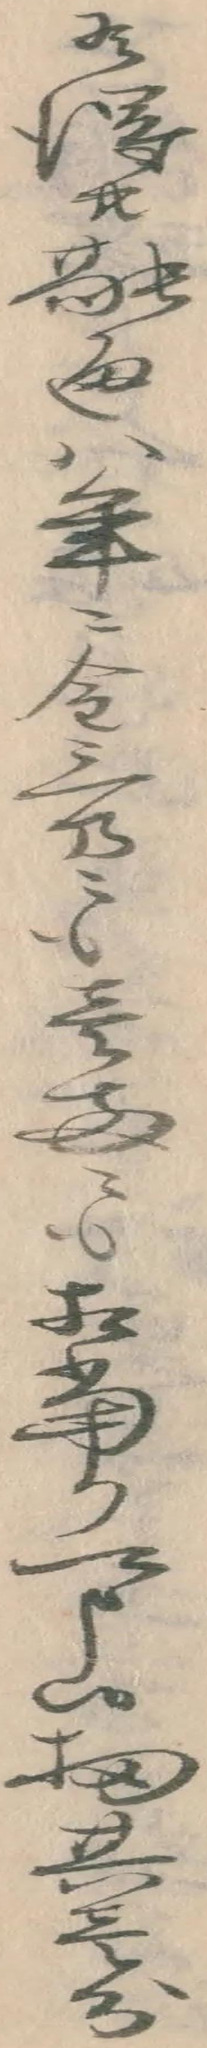候得共融通は年々金三分にも壱両にも相当り可申候扨其壱分
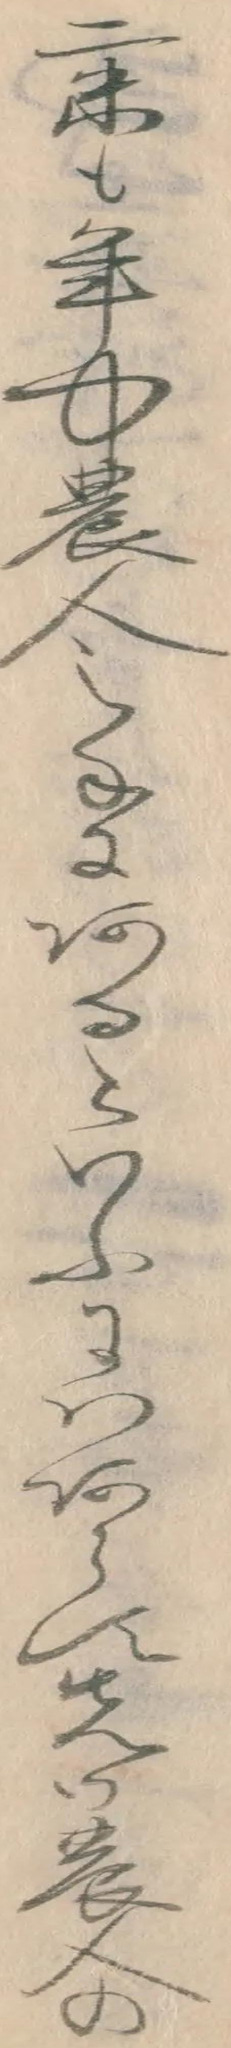二朱も年中農人之手にあるといふにはあらす先つ農人の
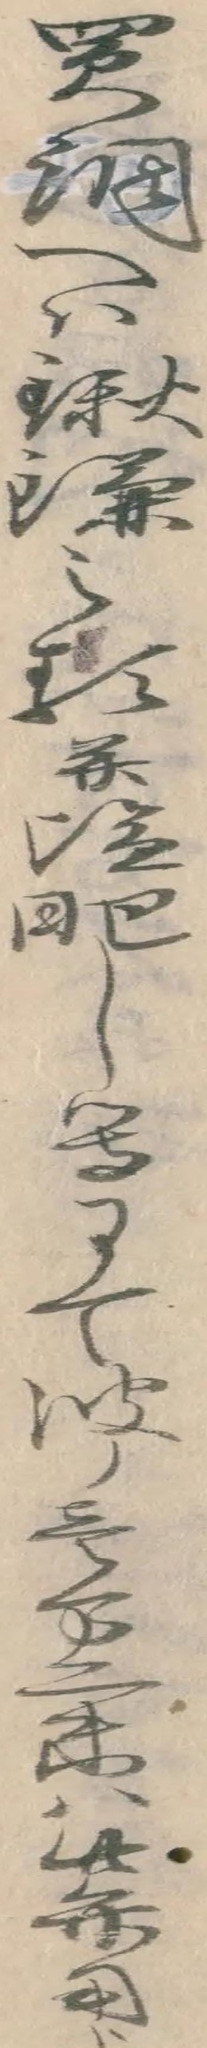買調へは鍬鎌之類并塩肥し等にて彼の壱分二朱は此弁用と
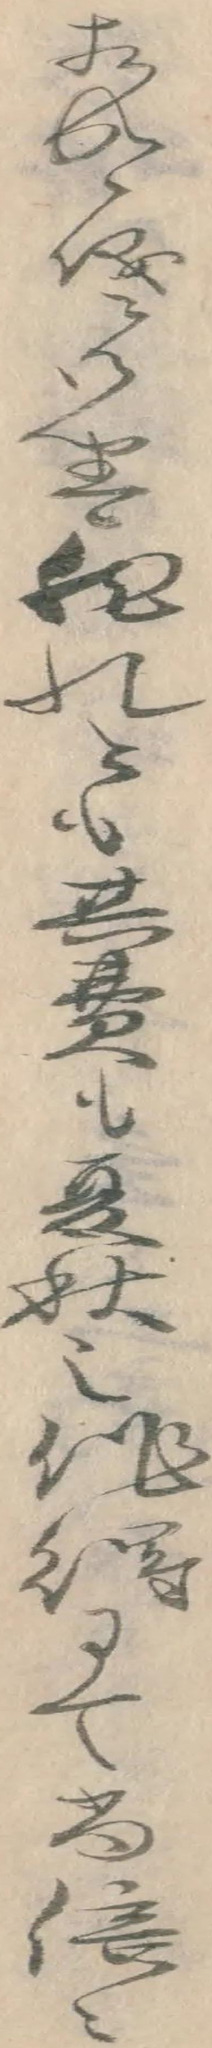相成候儀に御坐候然れとも其費も夏秋之作得にて尚倍々
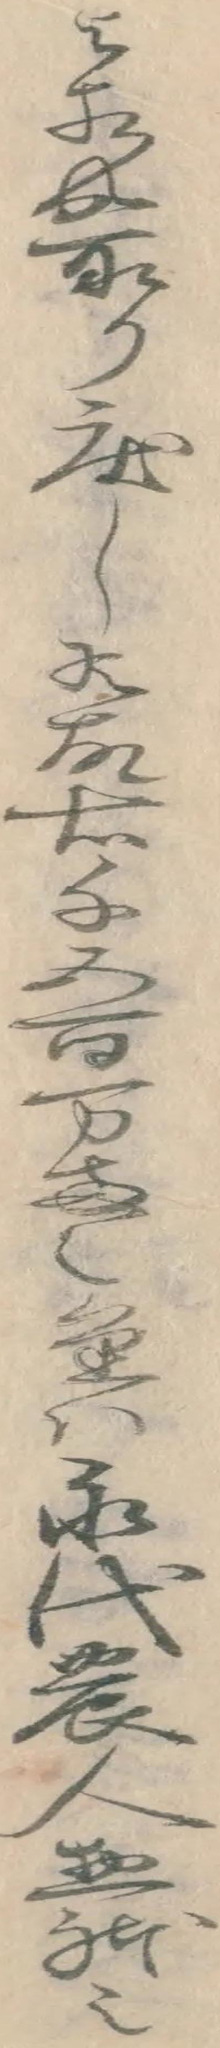と相成取り戻し候故右千五百万両之金は永代農人惣体之
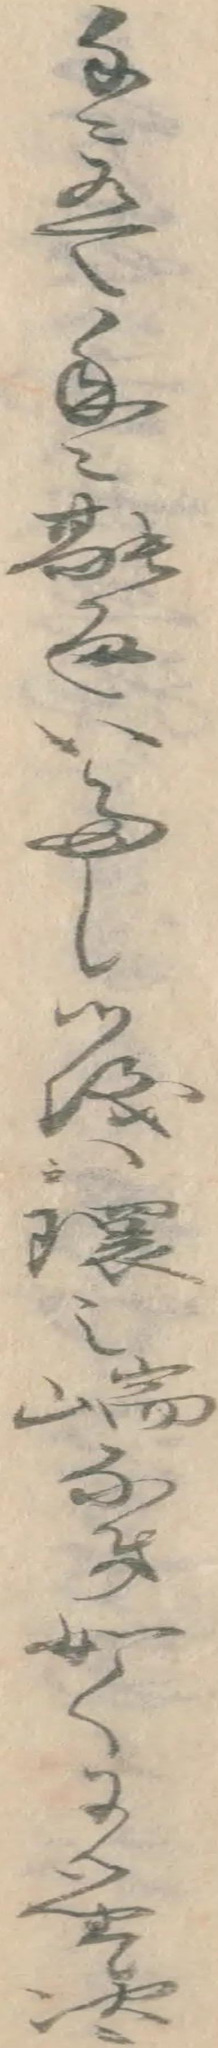手に有之年々融通いたし候儀は環之端なき如くに御坐候次に
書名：斎庭之穂
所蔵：国立国会図書館 National Diet Library, JAPAN
